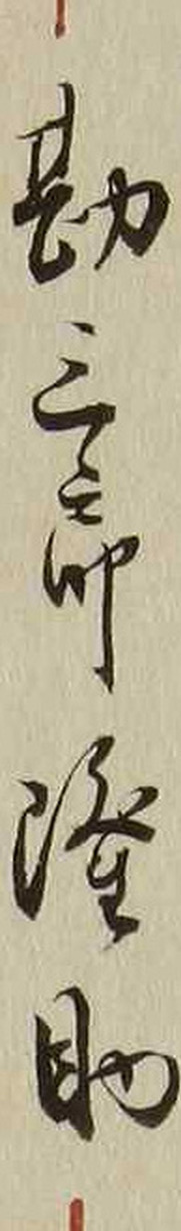勘三郎隆助
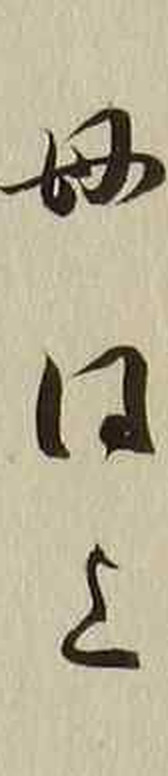母同上
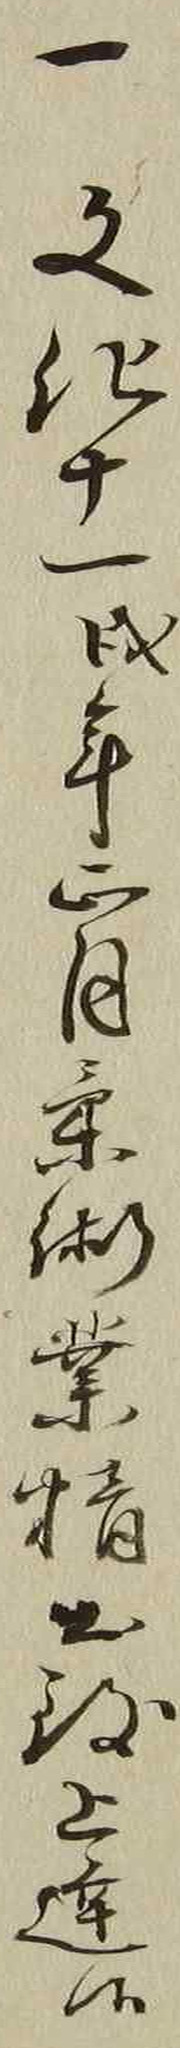一文化十一戌年正月柔術業精出致上達候
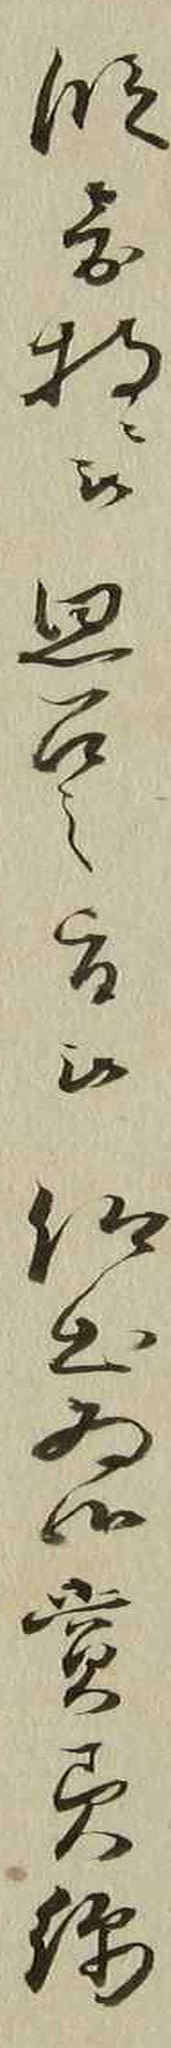段奇特ニ被思召之旨被仰出為御賞美綿
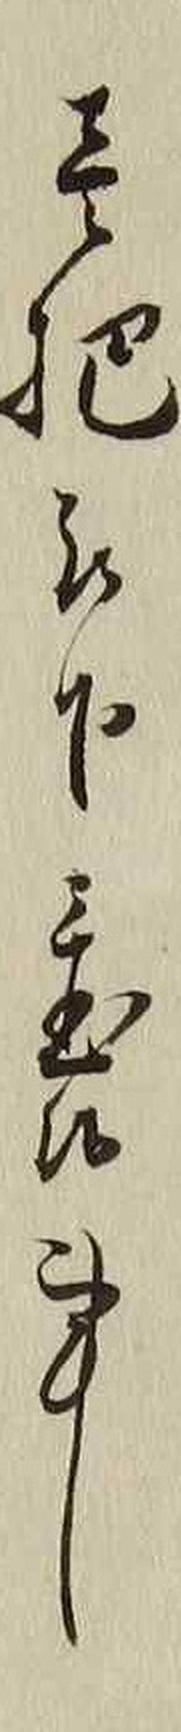壱把被下置候事
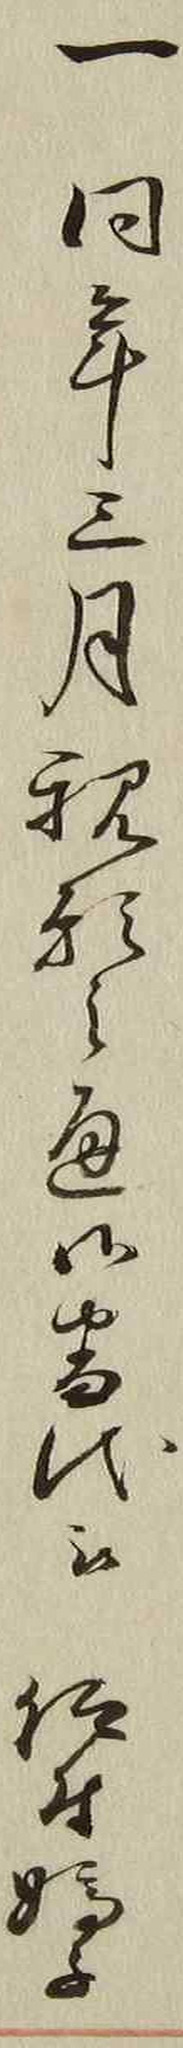一同年三月親願之通御番代被仰付嫡子
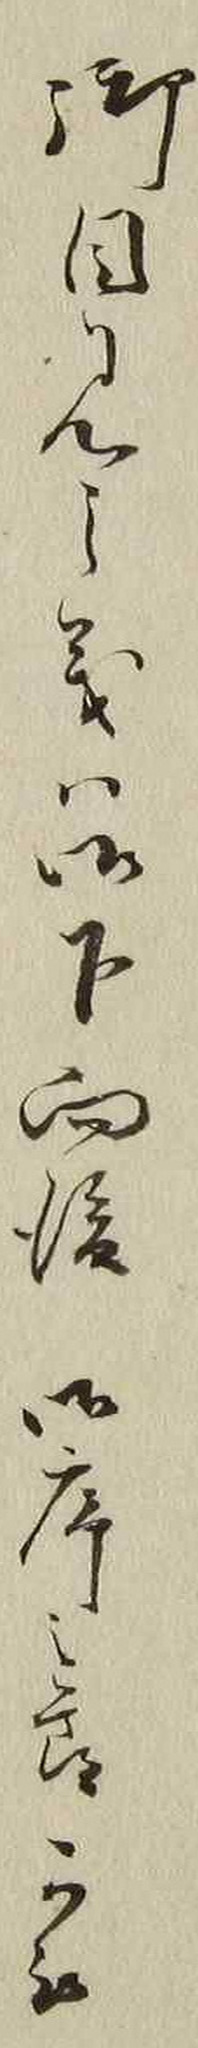御目見之義ハ御下向後御序之節可被
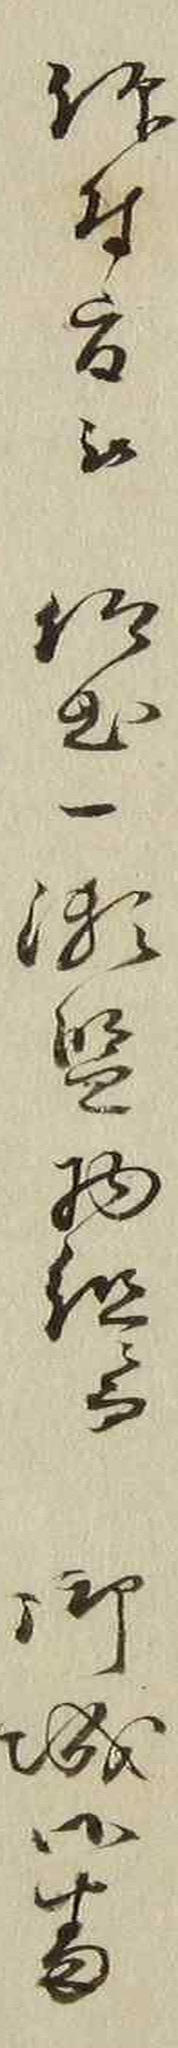仰付旨被仰出一瀬監物組ニ而御城御番
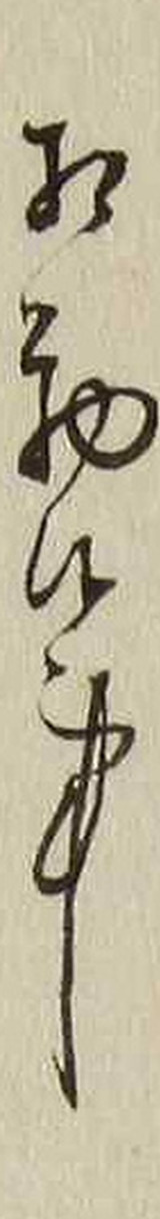相勤候事
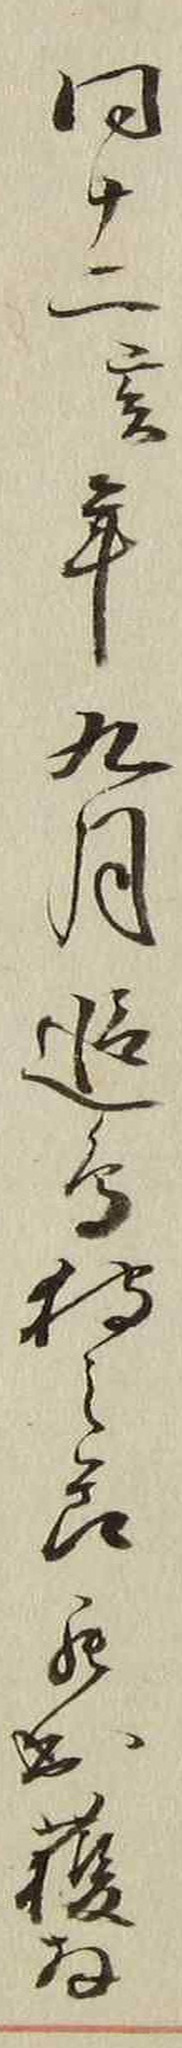同十二月亥年九月追鳥狩之節罷出獲拝
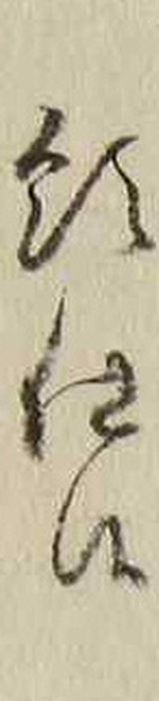領仕候
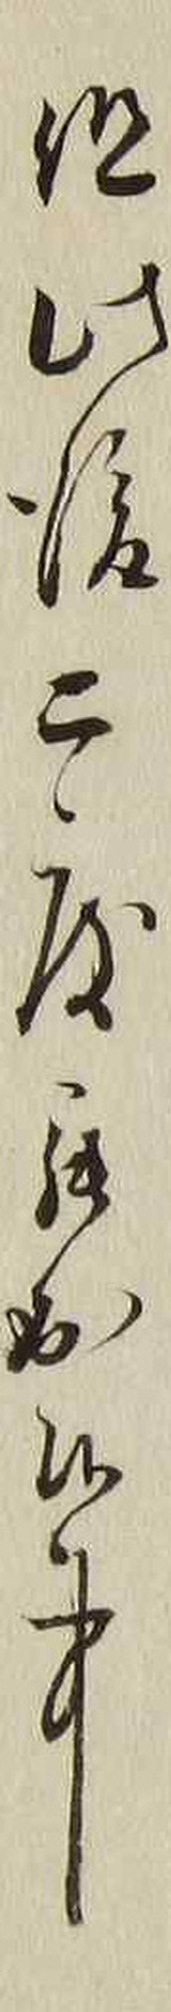但此後二度罷出候事
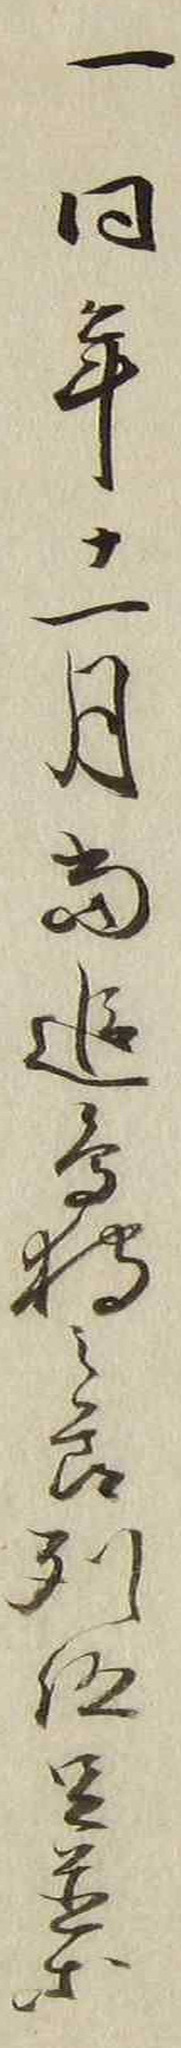一同年十一月当追鳥狩之節列伍足並等
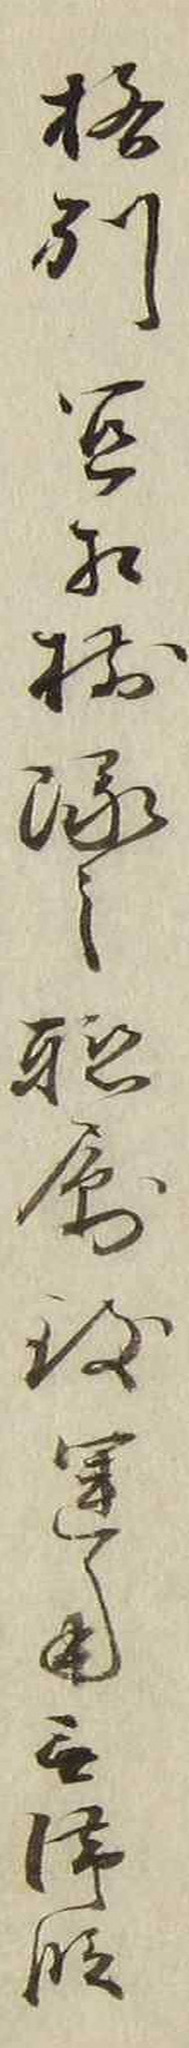各別宜相揃隊之聯属致運用無滞段

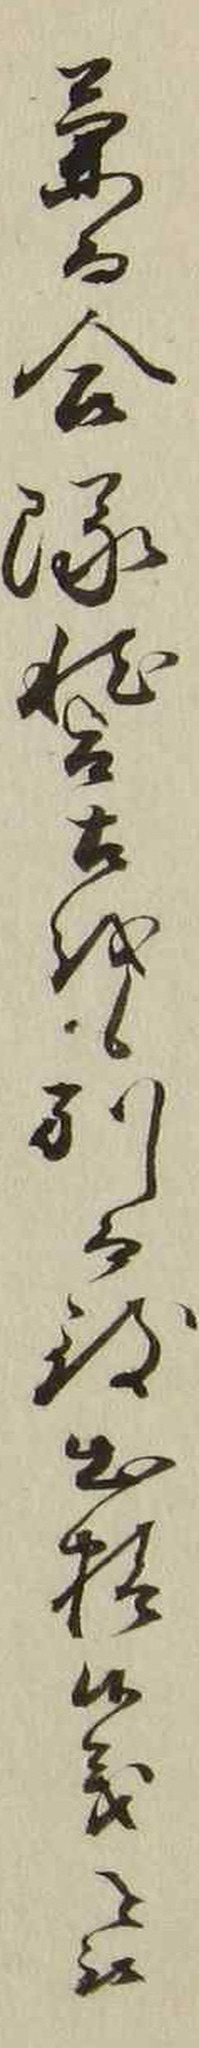兼而合隊稽古をも別而致出精候義と被
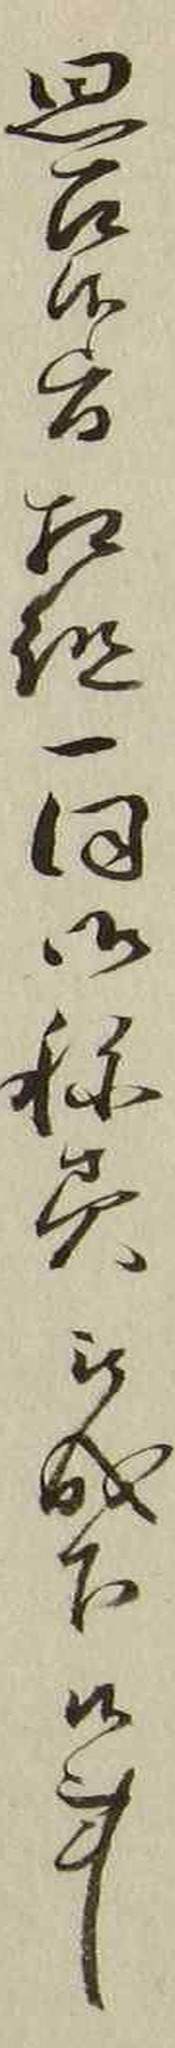思召候旨相組一同御称美被成下候事
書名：諸士系譜　巻之26　い之部26
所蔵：会津若松市立会津図書館
